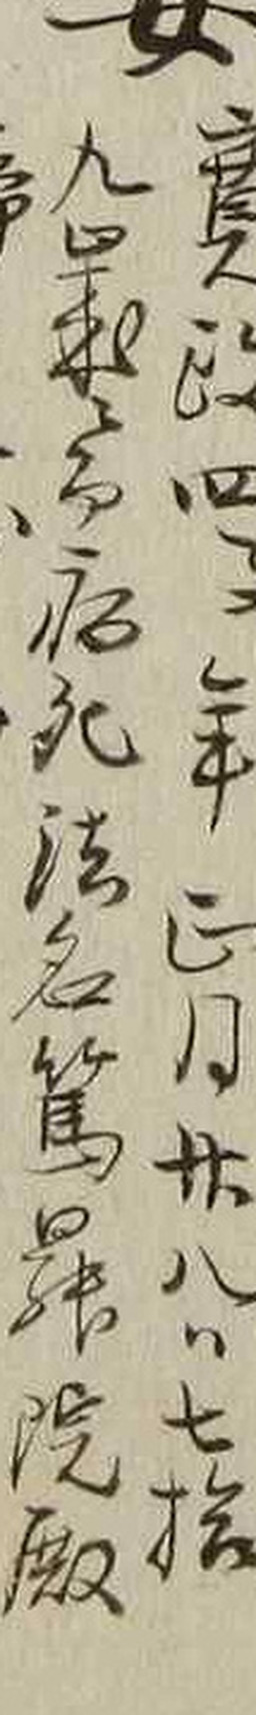九歳に而病死法名篤昇院殿
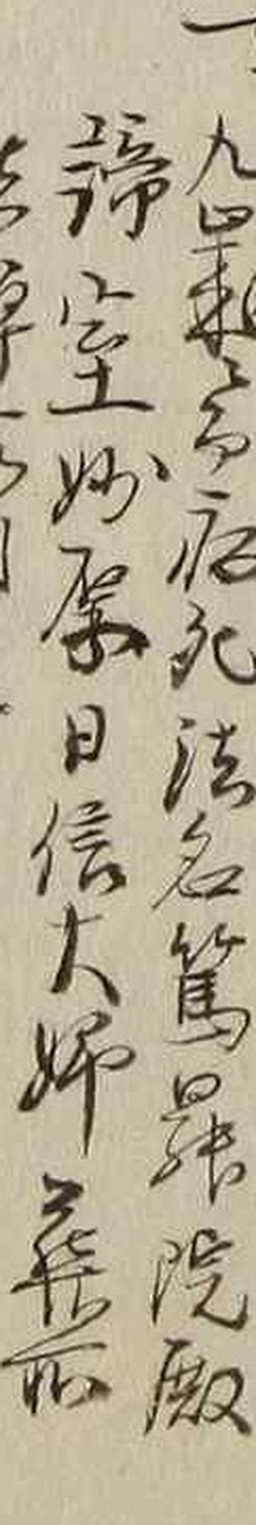諦室妙厚日信大姉葬所
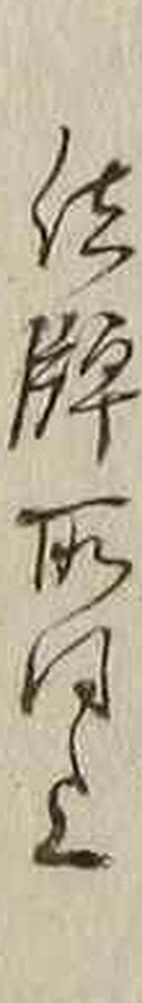位牌所同上
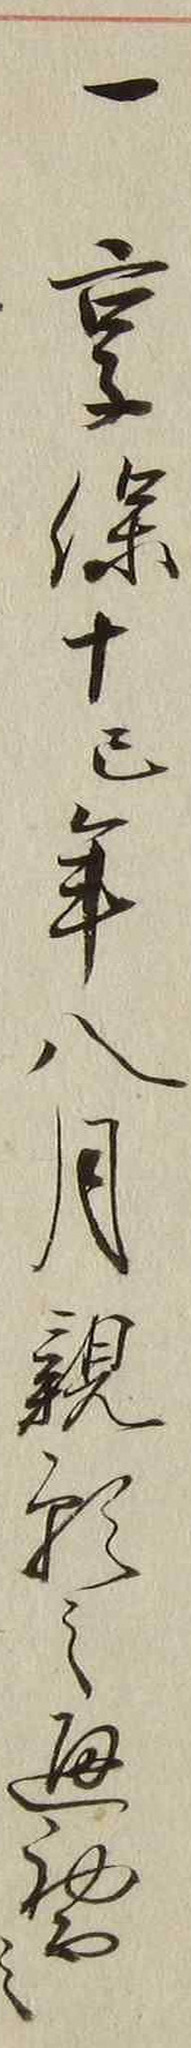一享保十巳年八月親願之通初而之
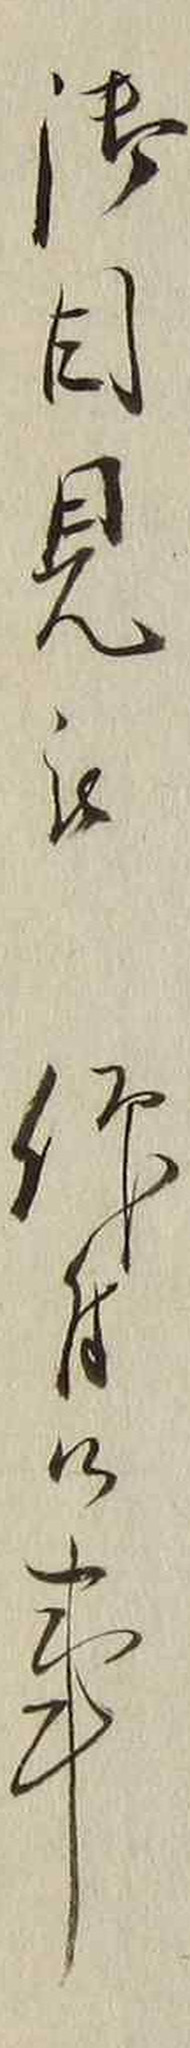御目見被仰付候事
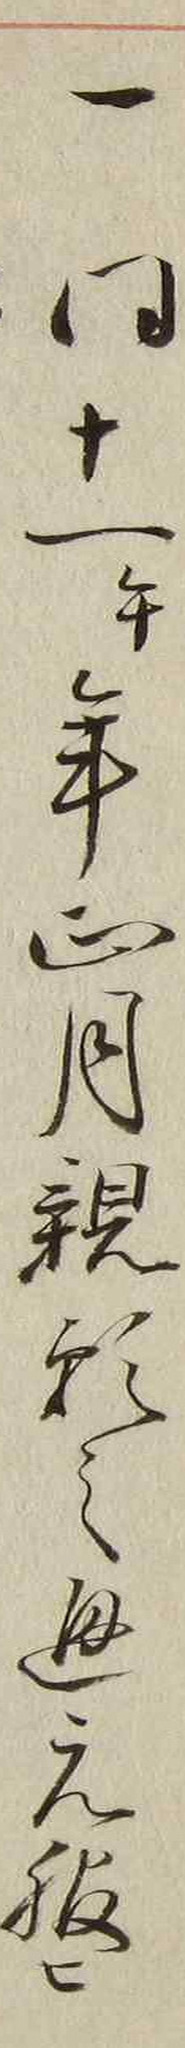一同十一午年正月親願之通元服被
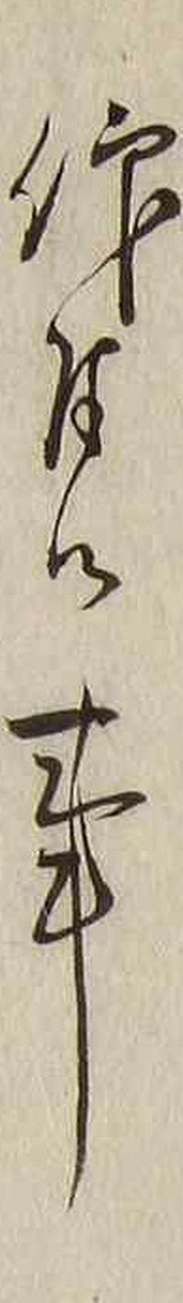仰付候事
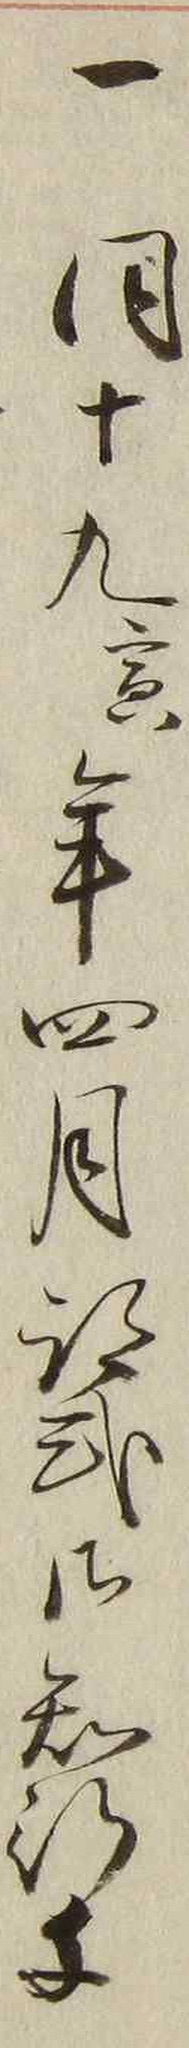一同十九寅年四月跡式御知行千
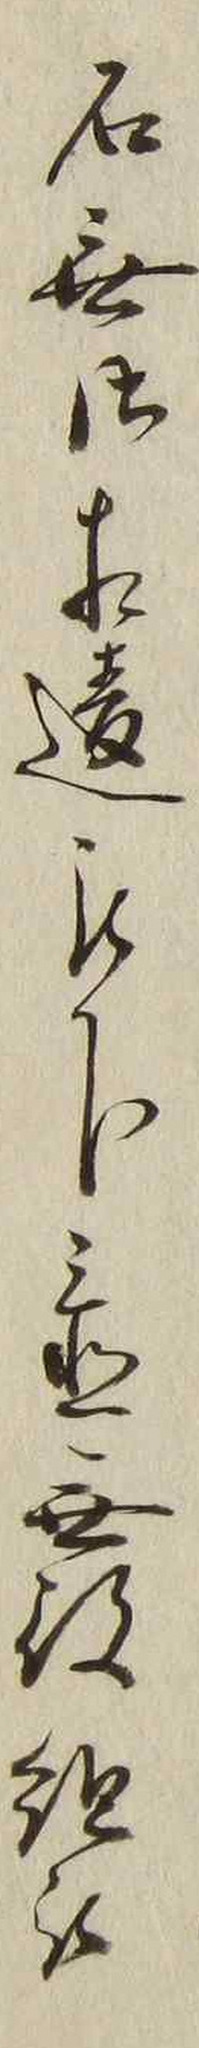石無御相違被下置無役組被

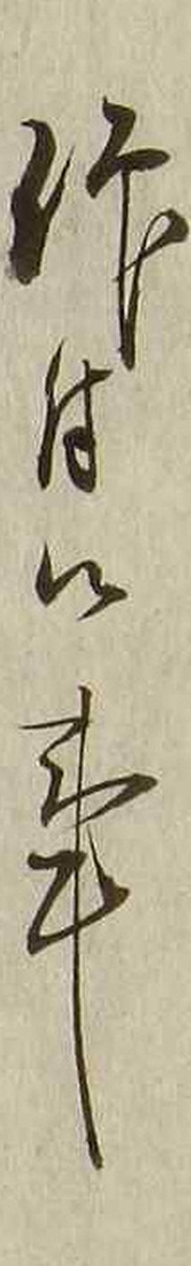仰付候事
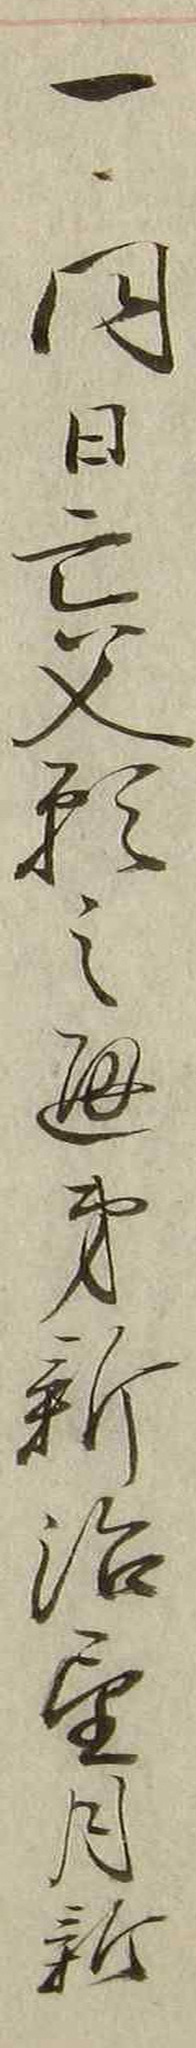一同日亡父願之通弟新治望月新
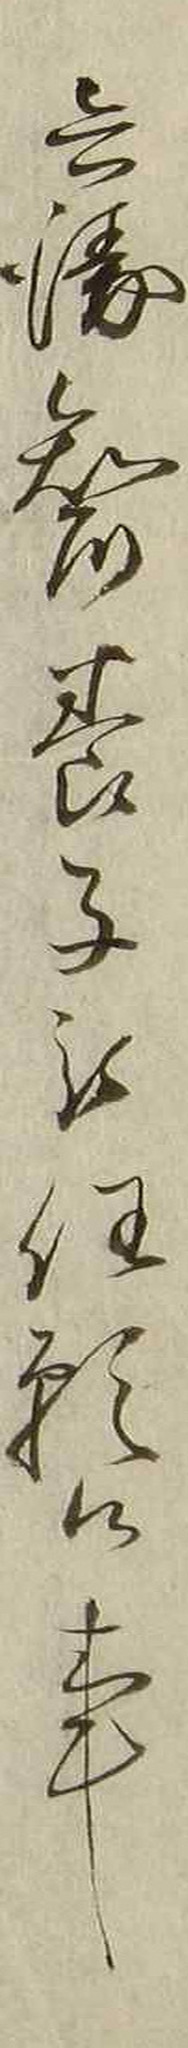兵衛聟養子被任願候事
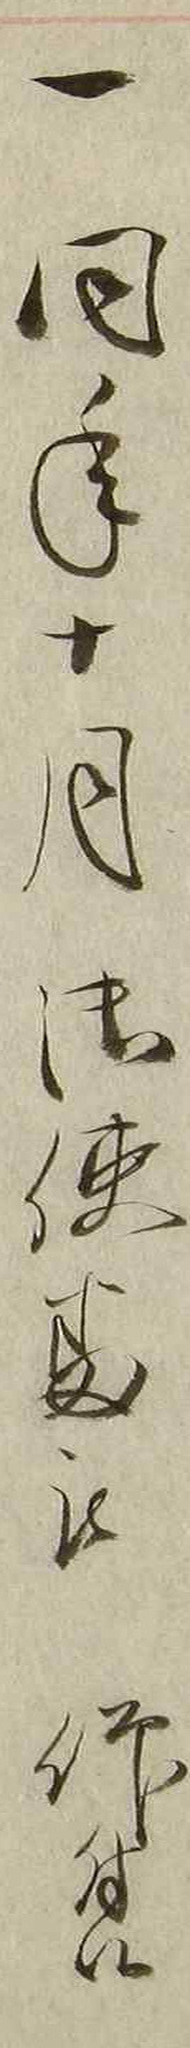一同年十月御使番被仰付候
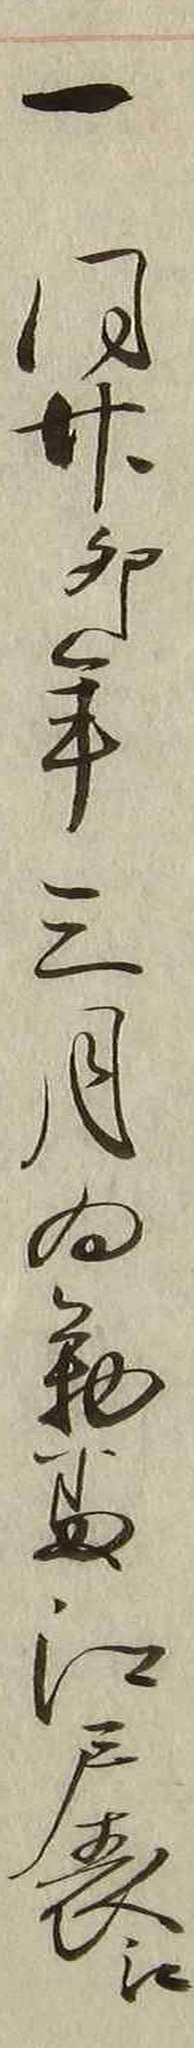一事同廿卯年三月為勤番江戸表江
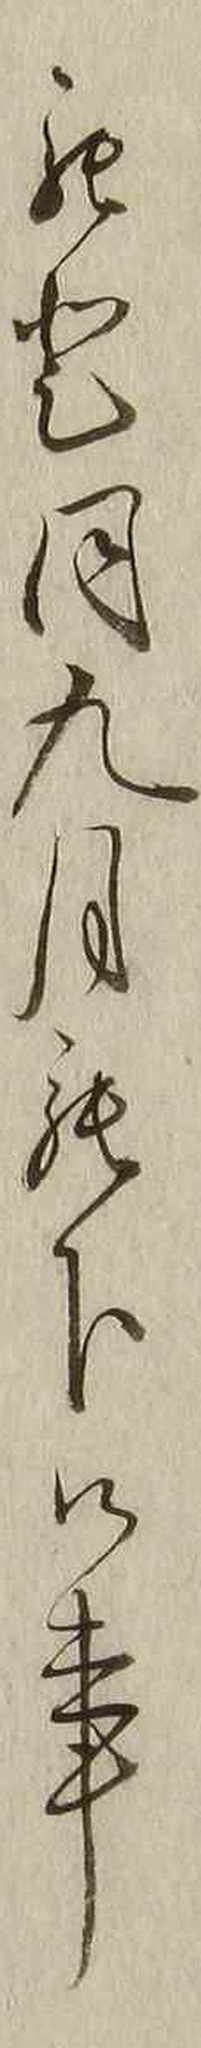罷登同九月罷下候事
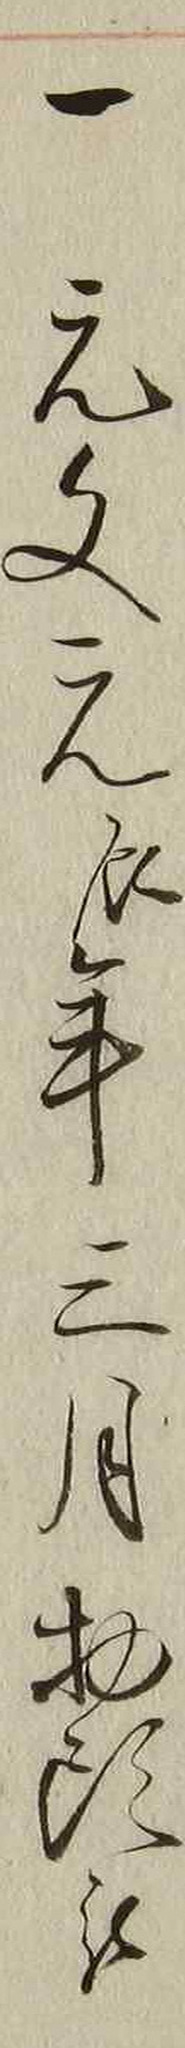一元文元辰年三月物頭被
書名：諸士系譜　巻之103　か之部11
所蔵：会津若松市立会津図書館
